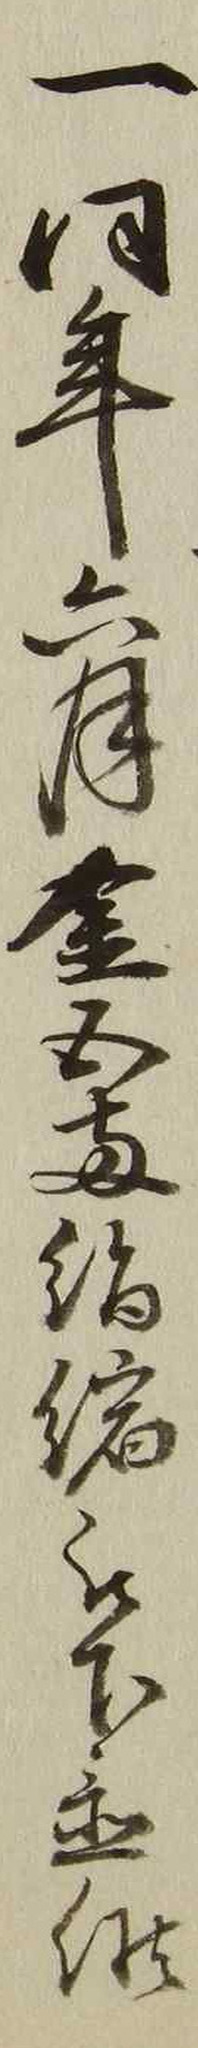一同年六月金五両絹縮被下置候
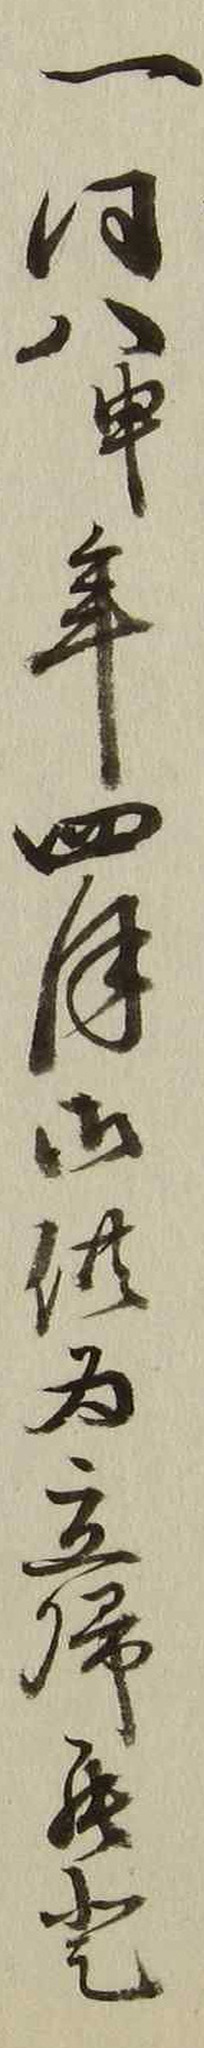一同八申年四月御供為立帰罷登
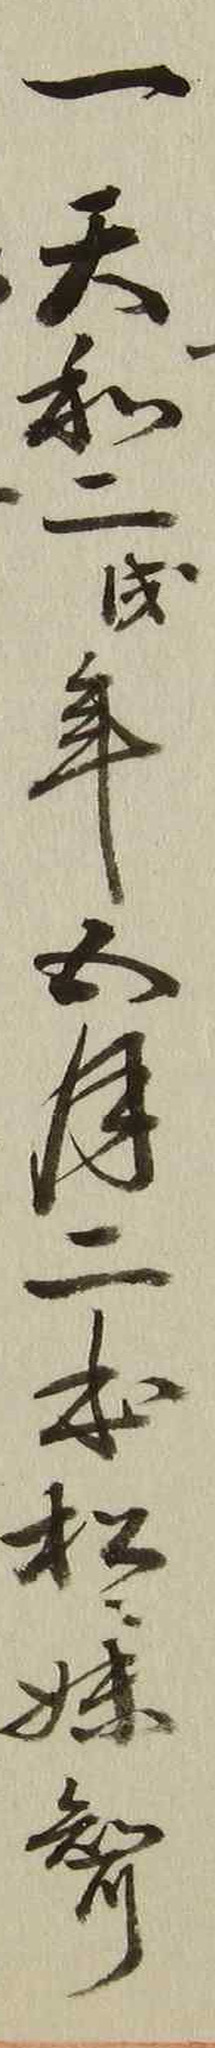一天和二戌年五月二本松ニ妹婿
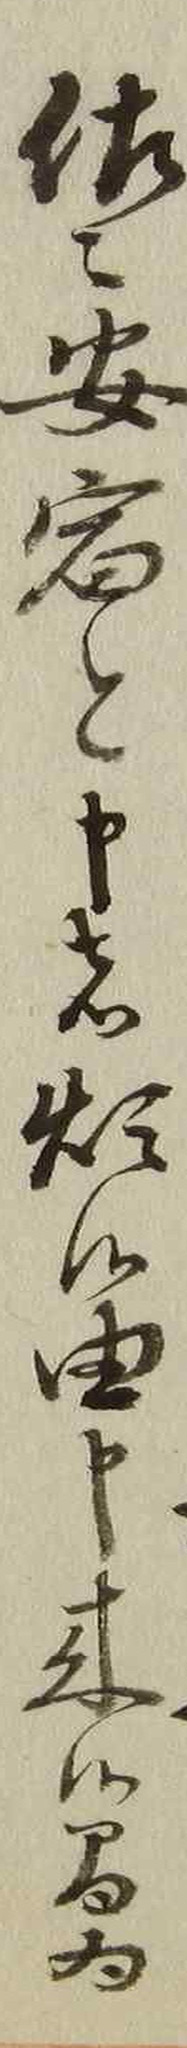佐々安富と申者煩候由申来候間為
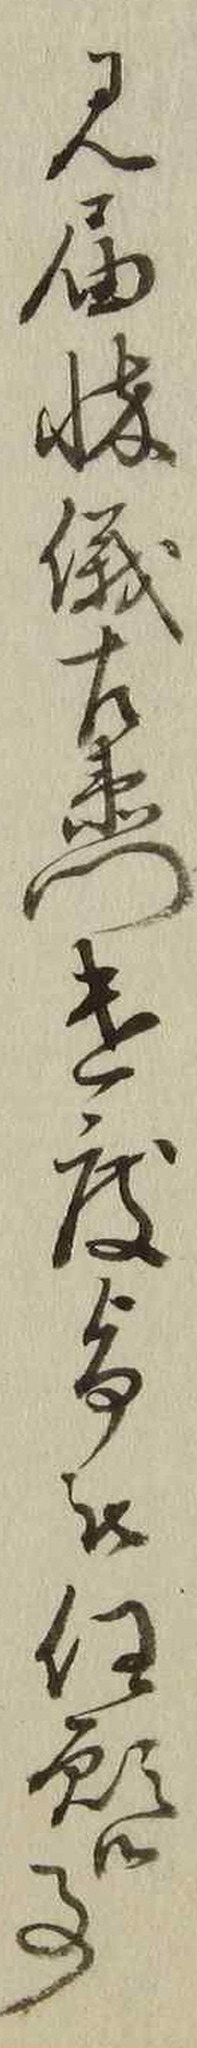見届忰儀左衛門遣度旨被伺願候事
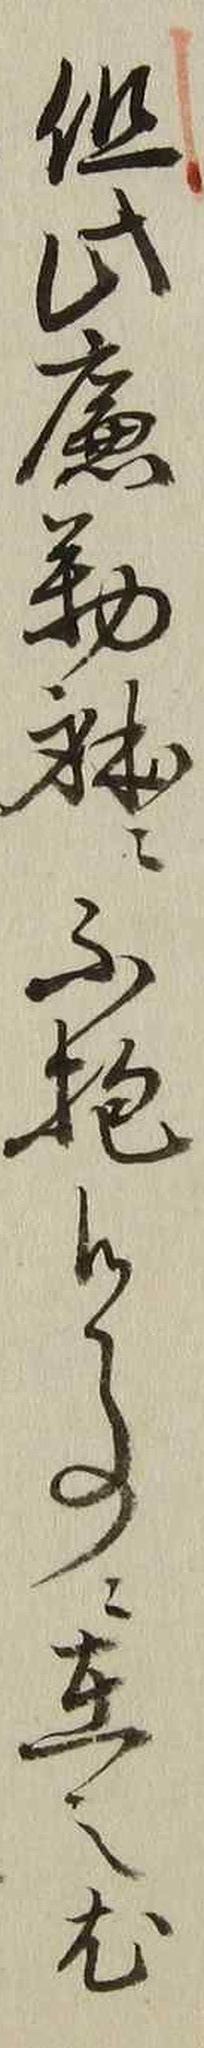但此広勤体ニ不抱候事ニ在之尤
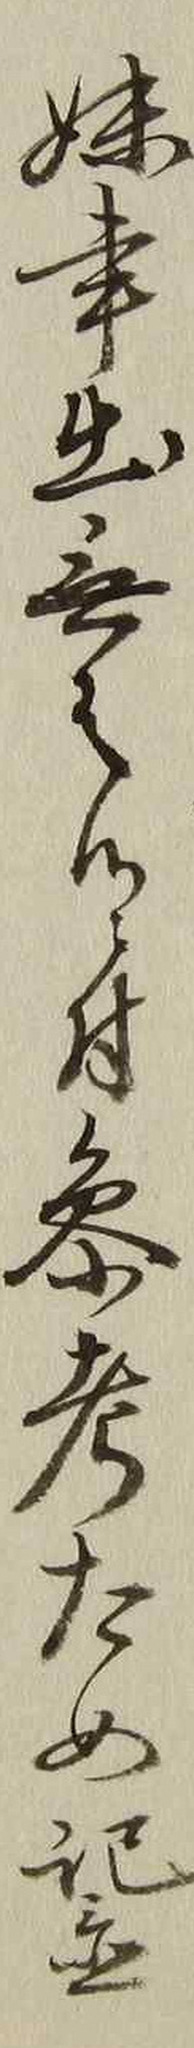妹事出無之候ニ付参考ため記置
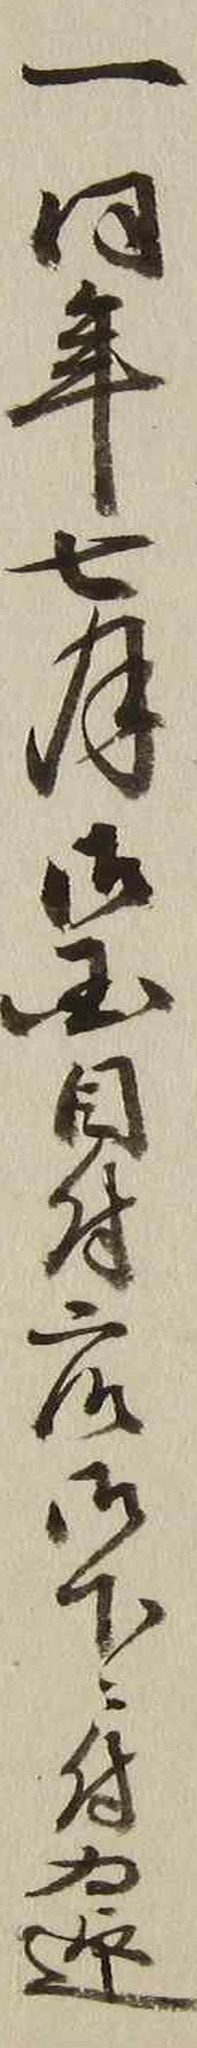一同年七月御国目付衆御下ニ付為迎
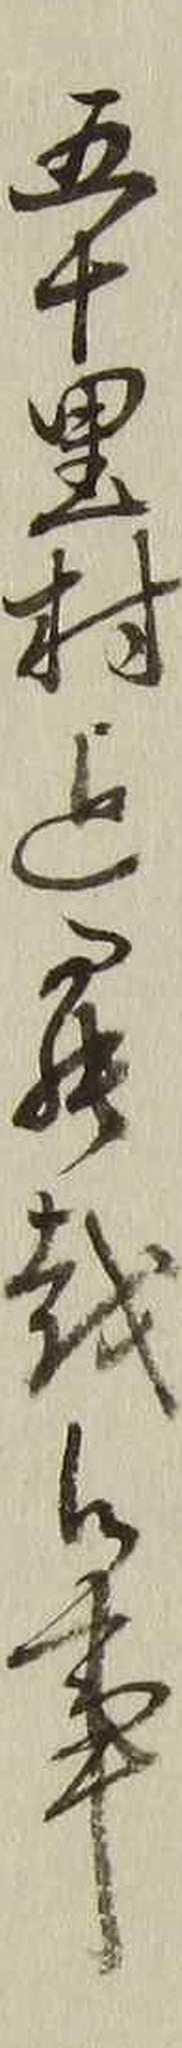五十里村迄罷越候事
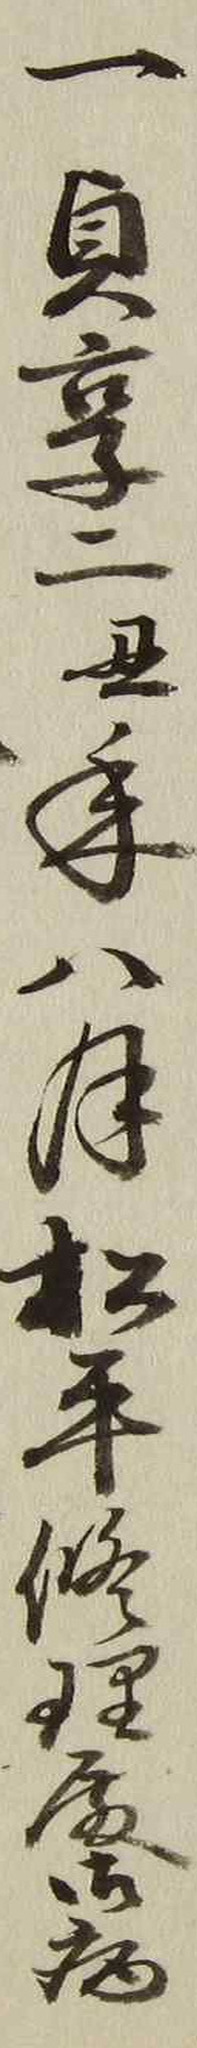一貞享二丑年八月松平修理殿御病
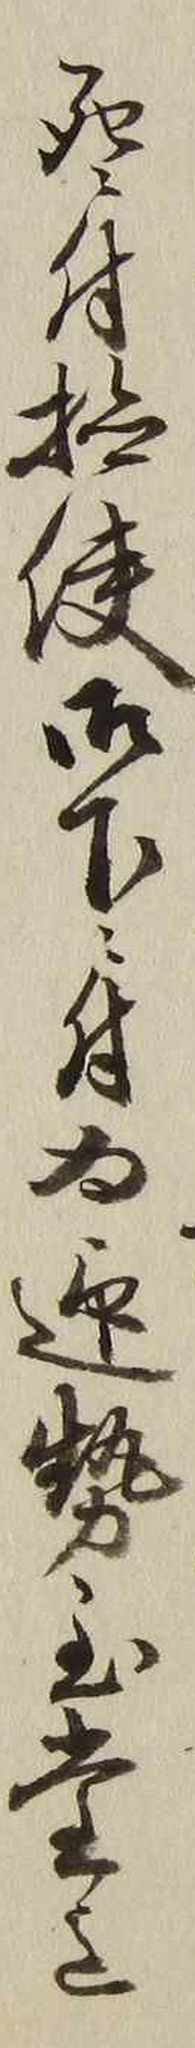死ニ付検使御下ニ付為迎勢至堂迄
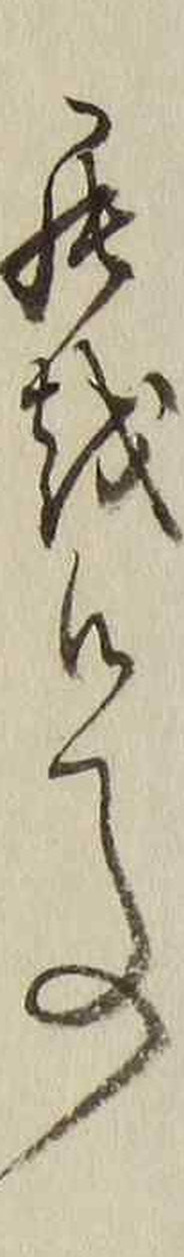罷越候事
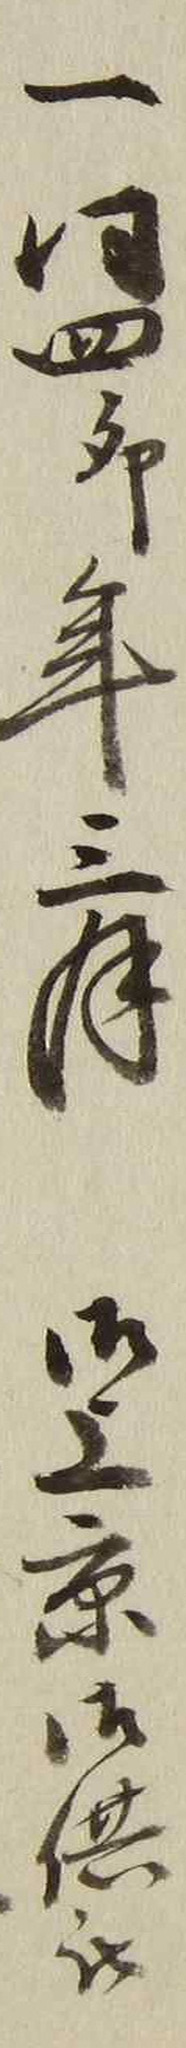一同四卯年三月御上京御供被
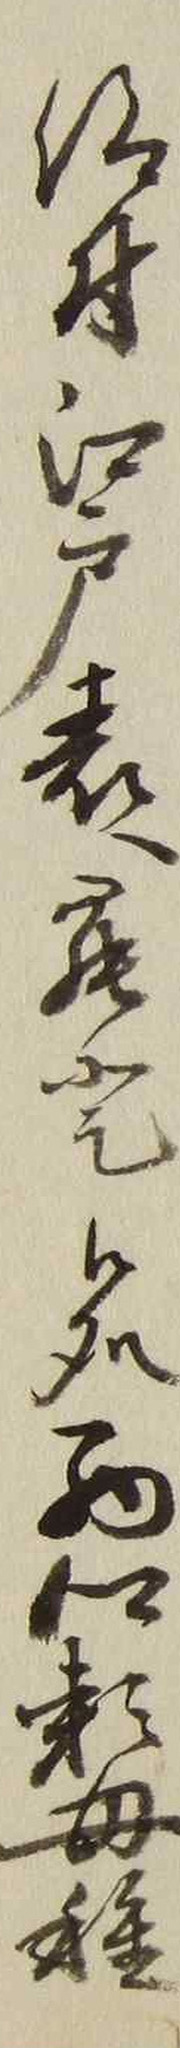仰付江戸表へ罷登候処西郷頼母種

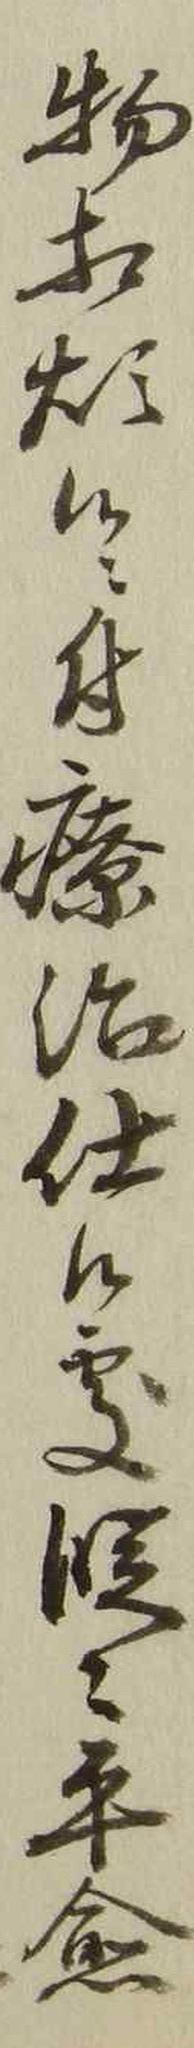物相煩候ニ付療治仕候処段々平愈
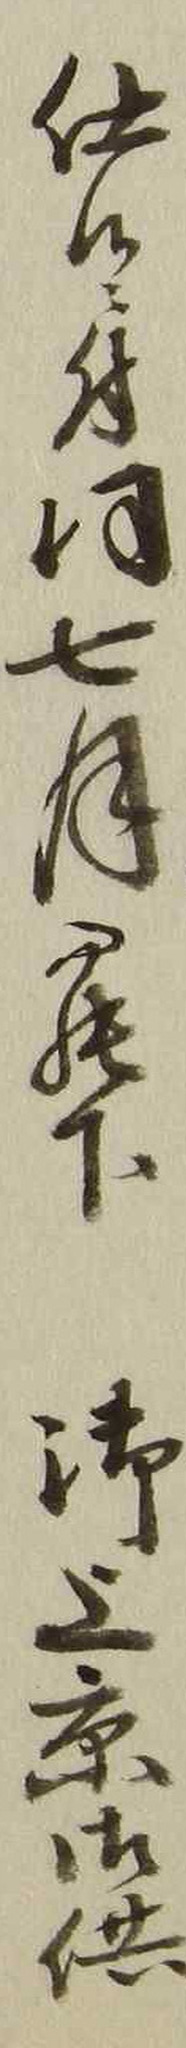仕候ニ付同七月罷下御上京御供
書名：諸士系譜　巻之31　い之部31
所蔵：会津若松市立会津図書館
